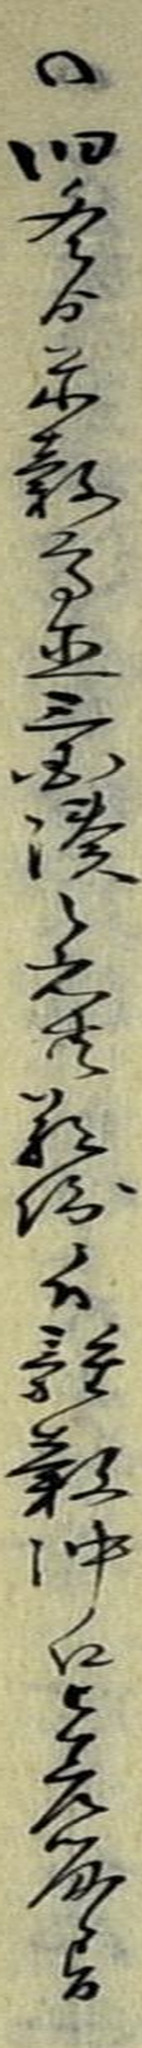〇旧冬ゟ米穀高直三国湊之者共難儀に付雑穀沖ノ口被差留候旨
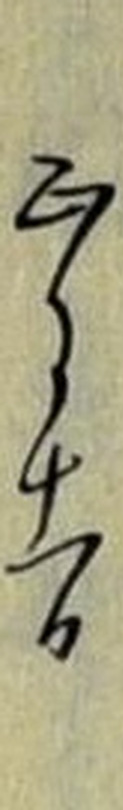正月十一日
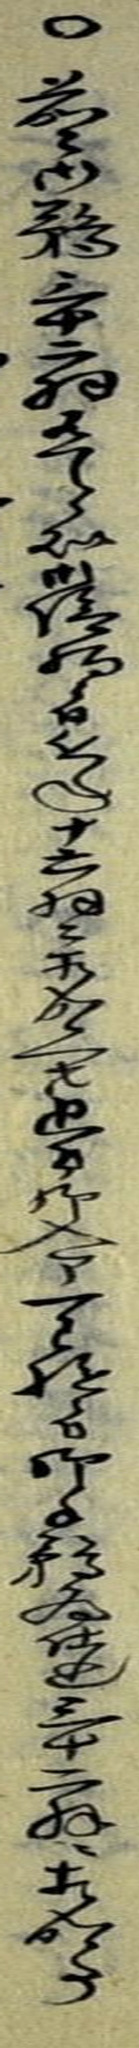〇前々御鵜三十二羽有之候処御倹約に付近年十六羽に相成候へ共近日御入部可被遊に付御手鵜為仕込三十二羽に相成候事
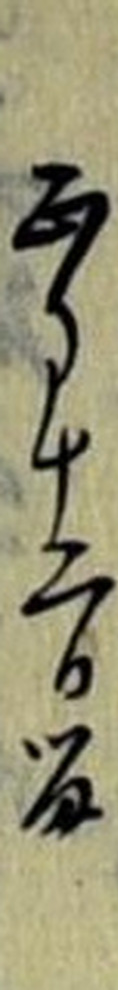正月十二日留
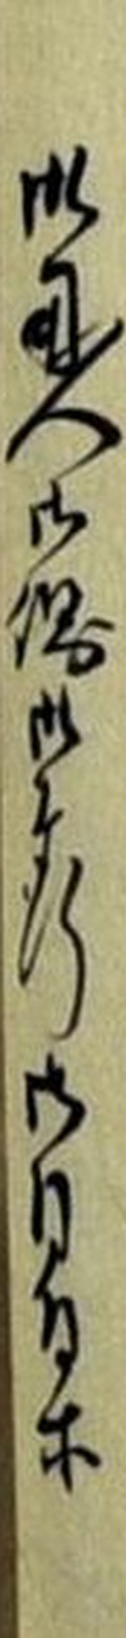御用人御側御奉行御目付等
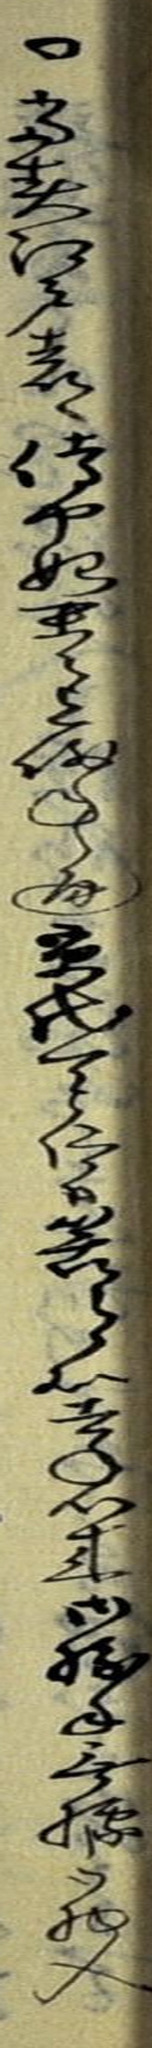〇当春江戸表へ侍中始末々迄例年之通交代可被仰付筈候処去年以来御勝手無拠御物入
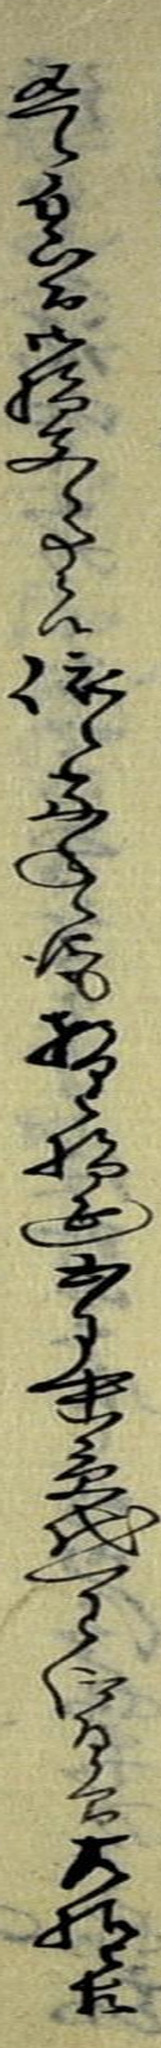有之ニ付候間御指支事に候依之当年之儀も暫被指延五月末交代可被仰付候間左様被相
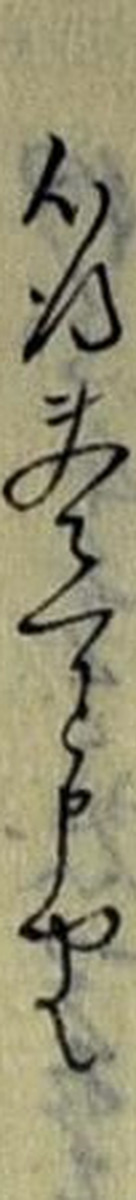心得夫々可被申聞候
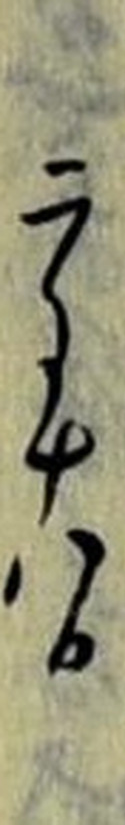二月十八日
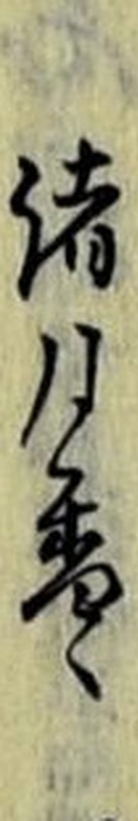諸月番へ
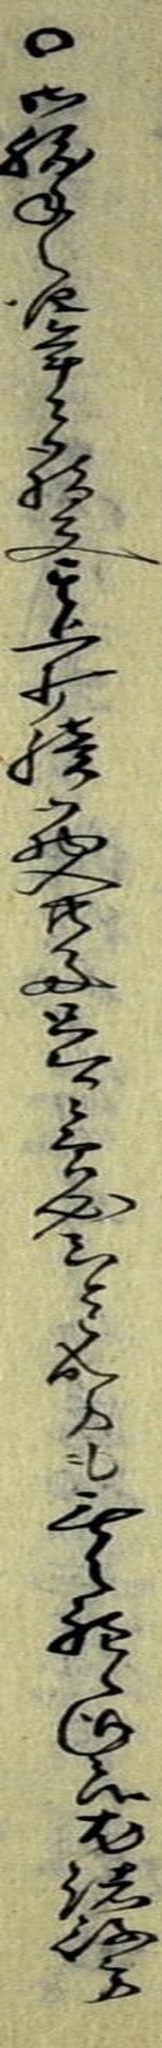〇御勝手之儀年々御指支其上打続御物入共多只今に而は必至と被成方も無之程之趣に候尤諸役方
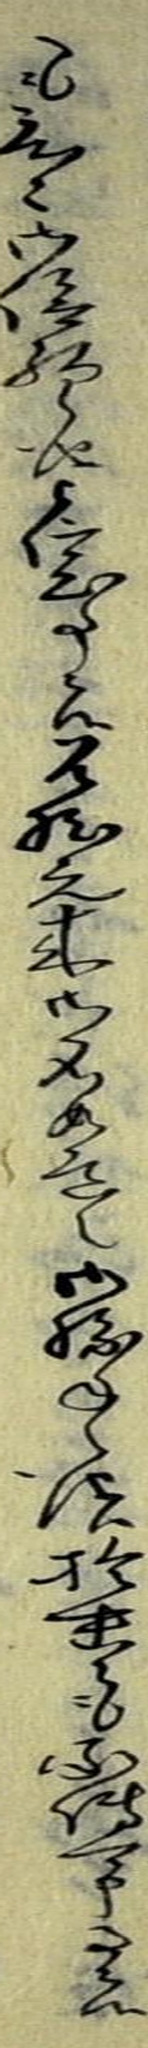へも度々御倹約之儀被仰出事に候乍然元来御不如意之御勝手之儀は於末々も承伝可申事に候
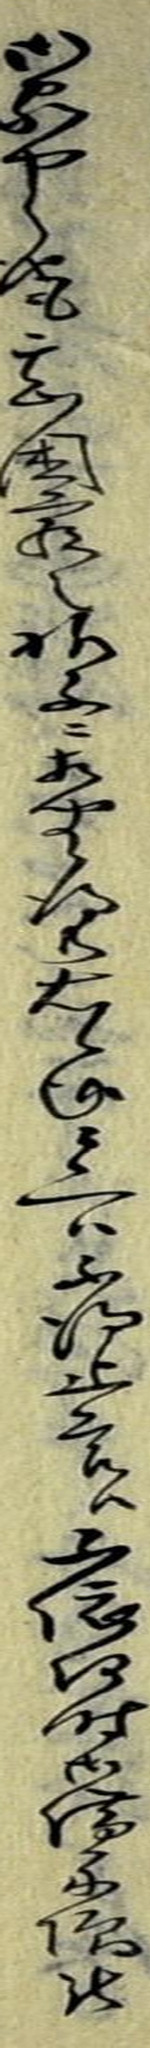御家中之儀も甚困窮之様子に相聞候得共右之趣に候へは不得止節は不依何時御借米増被
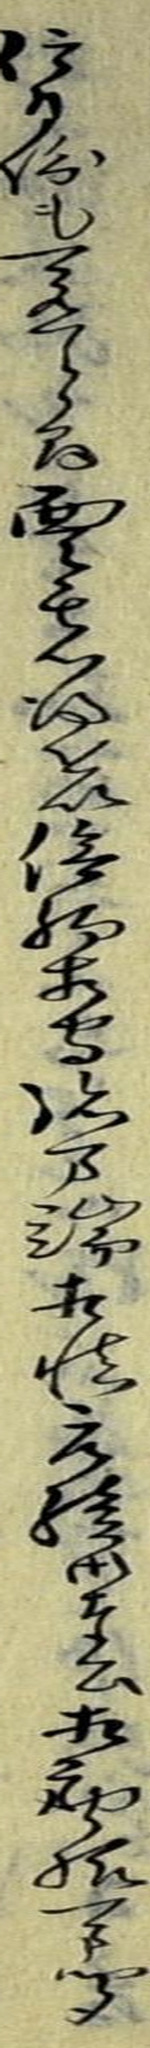仰付儀も可有之候間面々其心得を以倹約相守諸万端相慎取続御奉公相勤候様可申聞
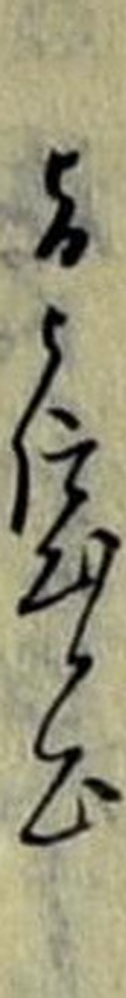旨被仰出候以上
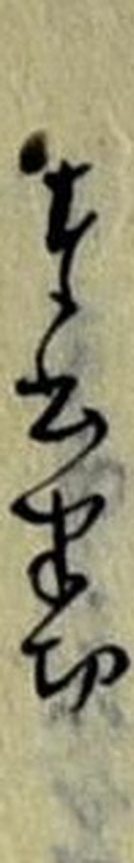奉書半切
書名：命令之部 二
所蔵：福井県文書館 Fukui Prefectural Archives
